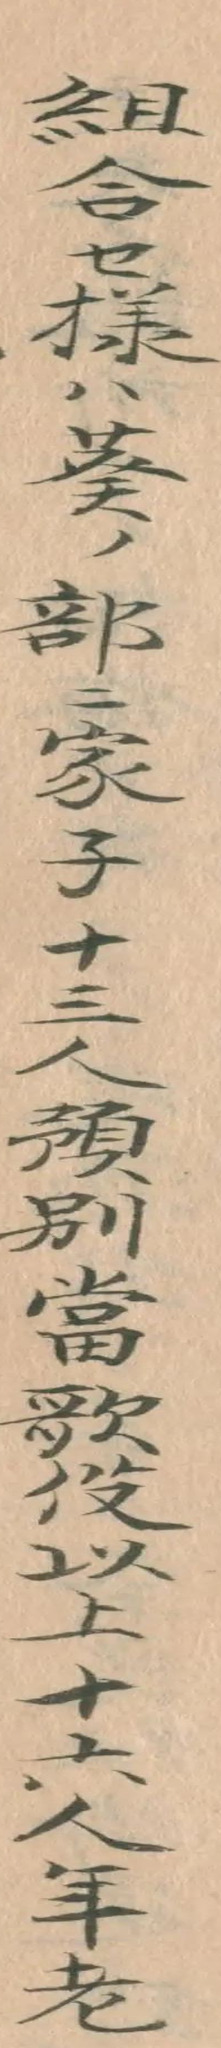一組合セ様ハ葵ノ部二家子十三人預別當歌役以上十六人年老
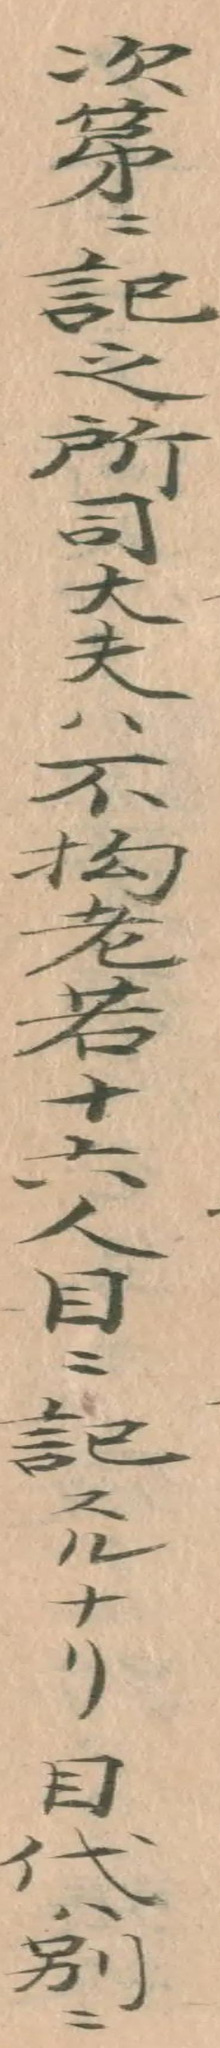次第ニ記之所司大夫ハ不拘老若十六人目ニ記スルナリ目代ハ別ニ
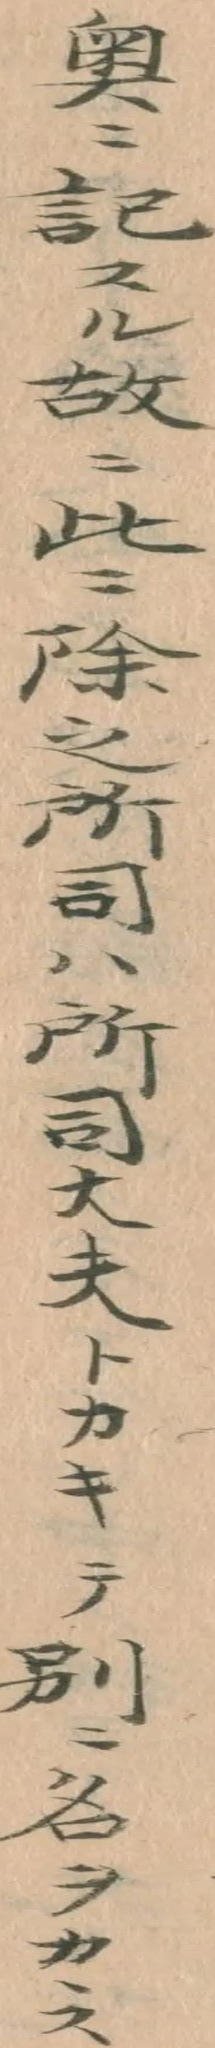奥ニ記スル故ニ此二除之所司ハ所司大夫トカキテ別ニ名ヲカヽス
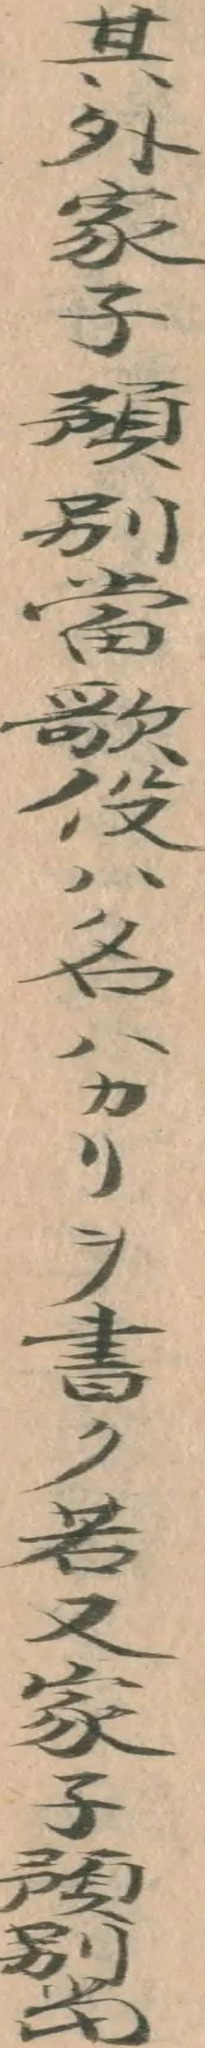其外家子頭別當歌役ハ名ハカリヲ書ク若又家子預別當
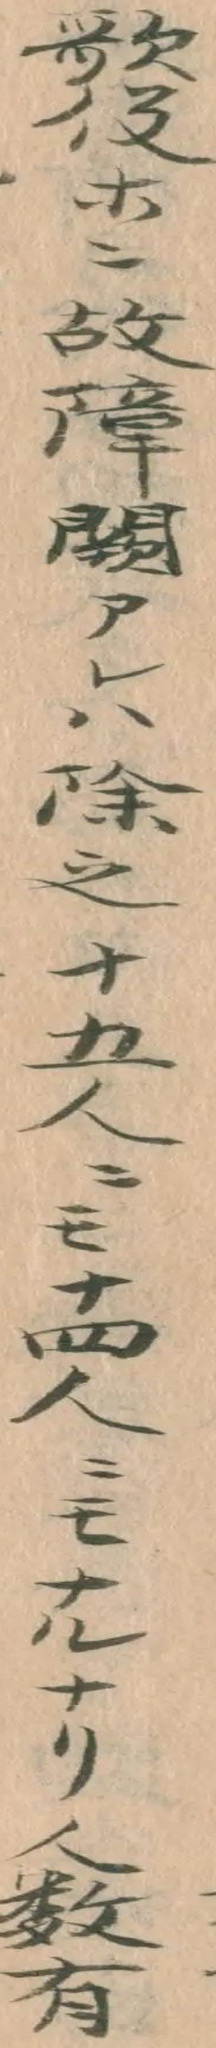歎役等ニ故障闕アレハ除之十五人ニモ十四人ニモナルナリ人数有
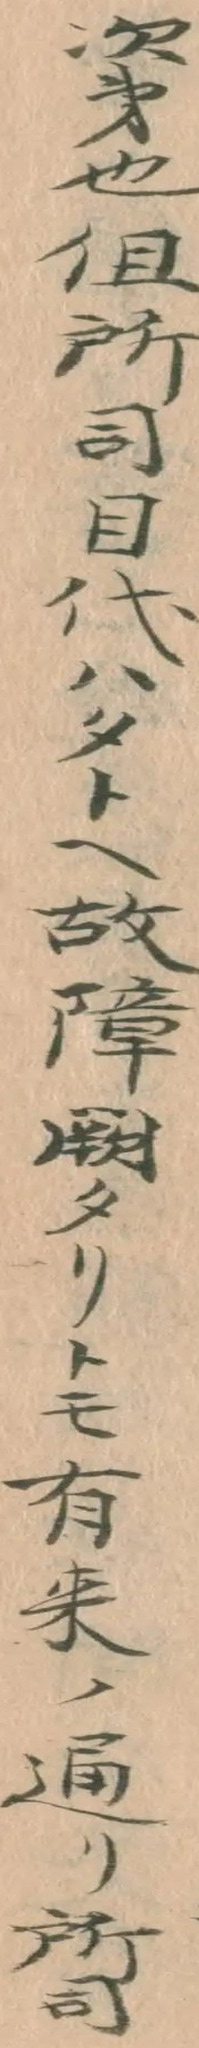次第也但所司目代ハタトヘ故障闕タリトモ有来ノ通リ所司
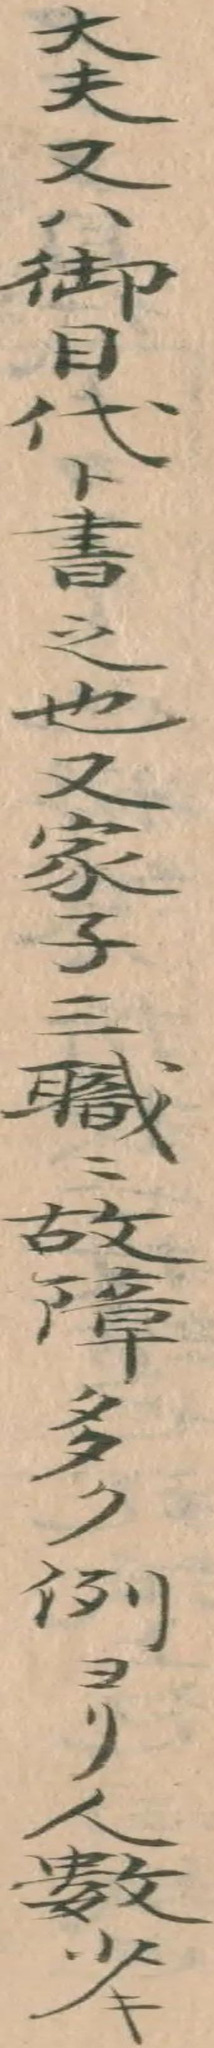大夫又ハ御目代ト書之也又家子三職ニ故障多ク例ヨリ人数少キ
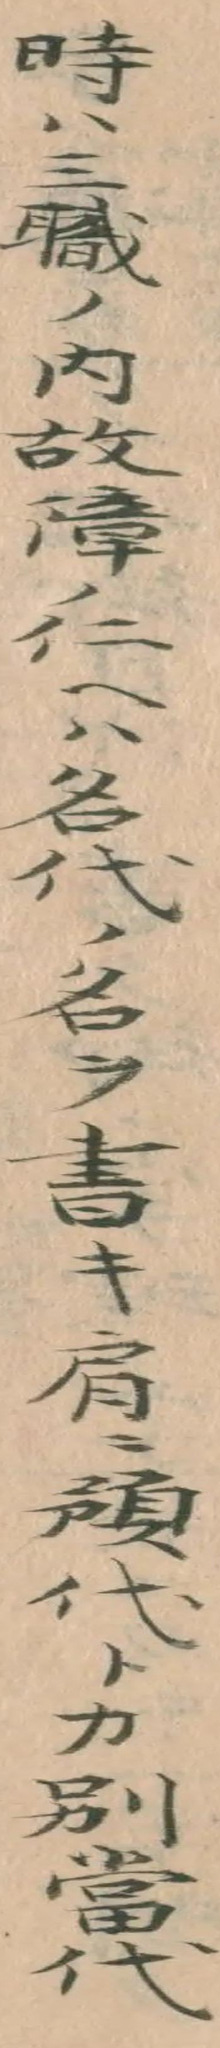時ハ三職ノ内故障ノ仁ヘハ名代ノ名ヲ書キ肩ニ預代トカ別當代
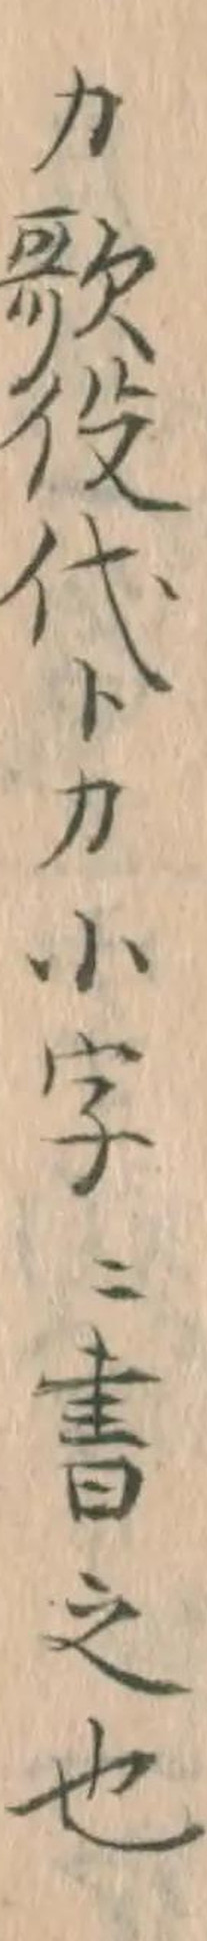カ歌役代トカ小字ニ書之也
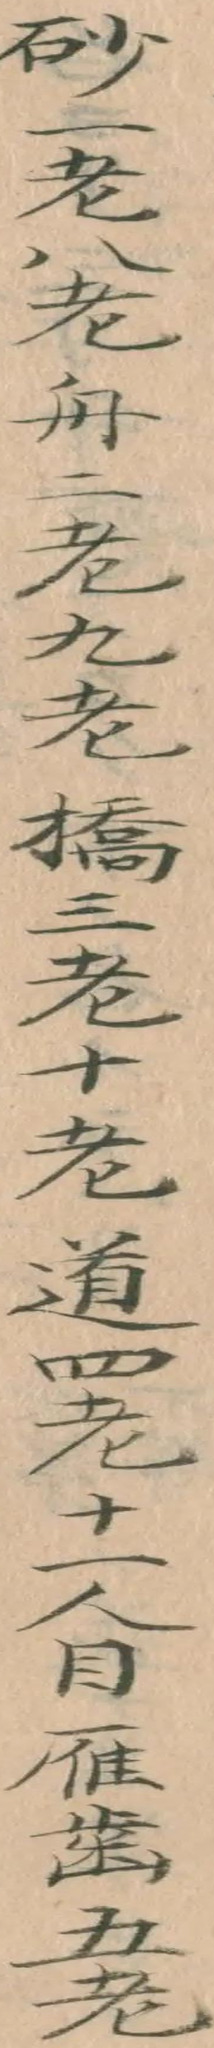砂一老八老舟二老九橋三老十老道四老十一人目雁歯五老
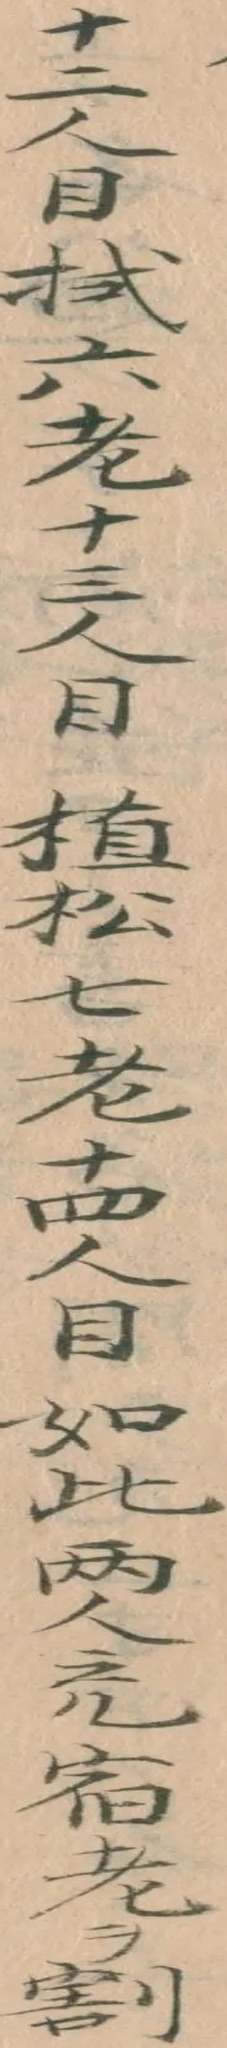十二人目拭六老十三人目植松七老十四人目如此両人充宿老ヲ割
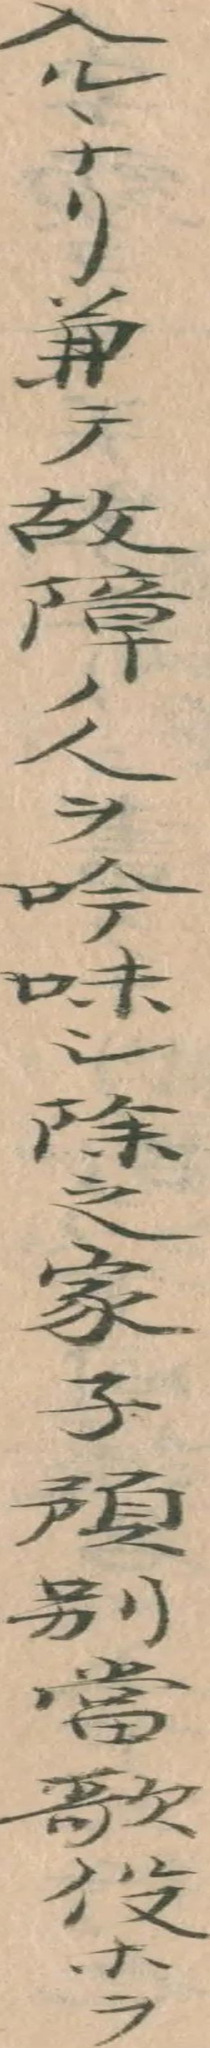入ルヽナリ兼テ故障ノ人ヲ吟味シ除之家子預別當歌役等ヲ
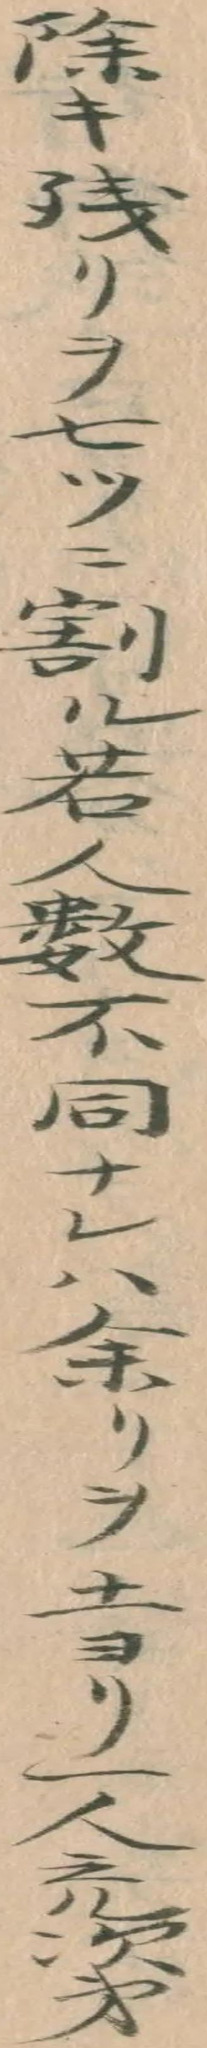除キ残リヲ七ツニ割ル若人數不同ナレハ余リヲ土ヨリ一人充次第
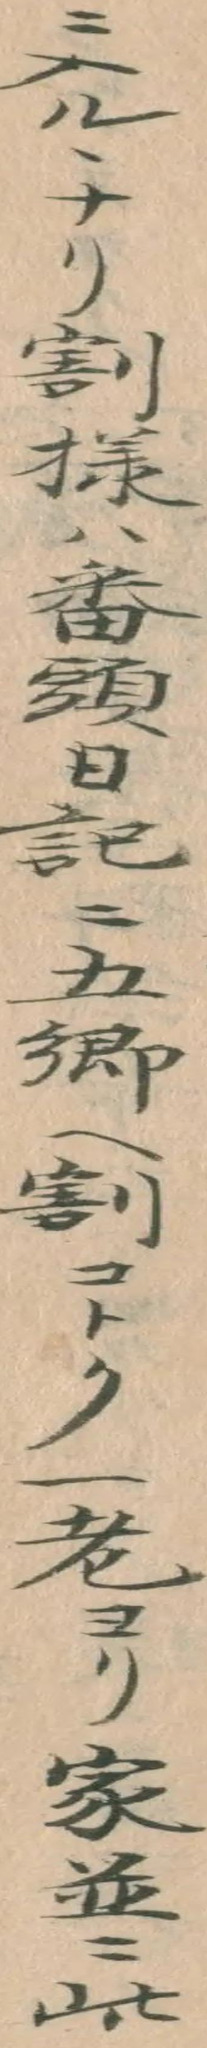ニ入ルヽナリ割様ハ番頭日記ニ五郷へ割コトク一老ヨリ家並ニ此
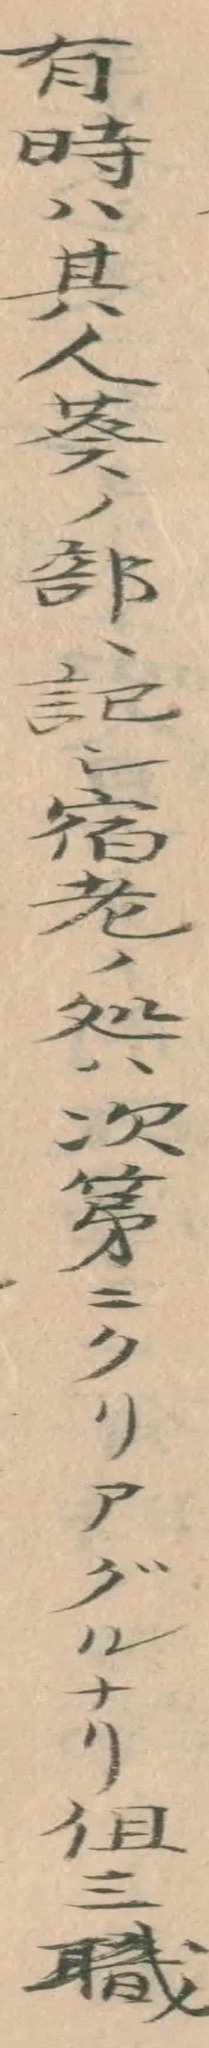有時ハ其人葵ノ部ヘ記シ宿老ノ処ハ次第ニクリアグルナリ但三職
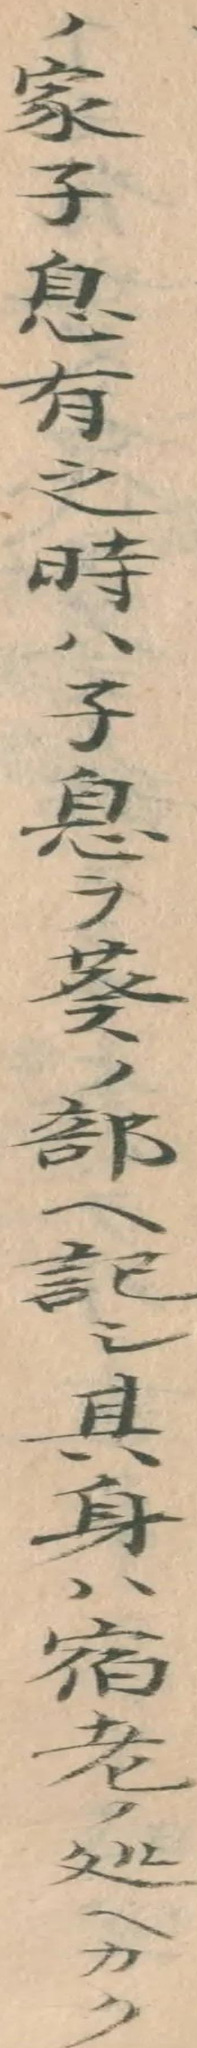ノ家子息有之時ハ子息ヲ葵ノ部へ記シ其身ハ宿老ノ処ヘカク
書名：賀茂社記録. 第40冊
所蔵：国立国会図書館 National Diet Library, JAPAN
